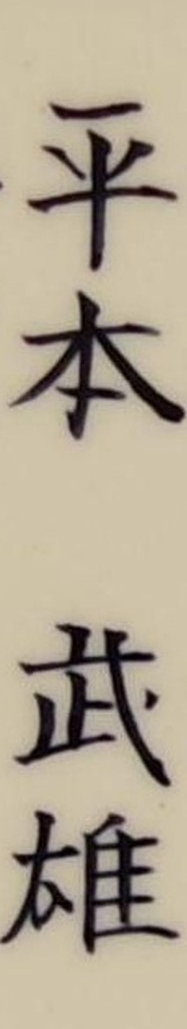平本武雄
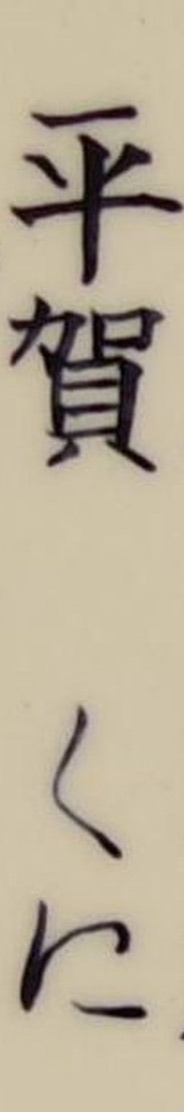平賀くに
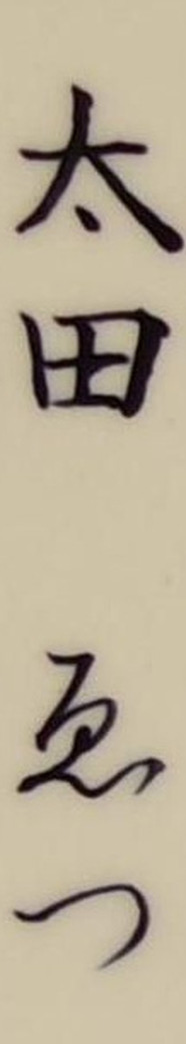太田ゑつ
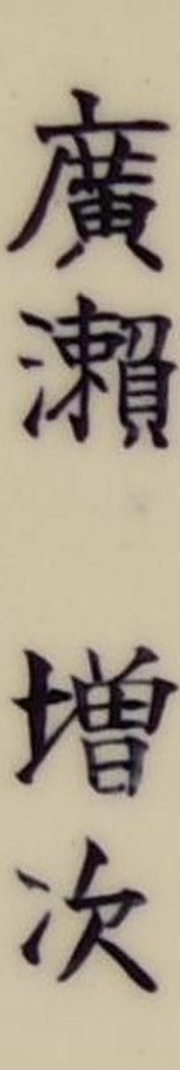広瀬増次
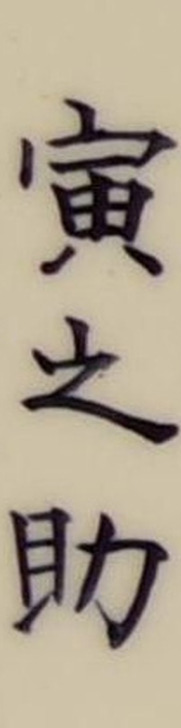寅之助

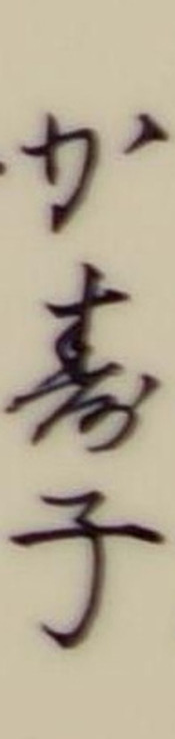かす子
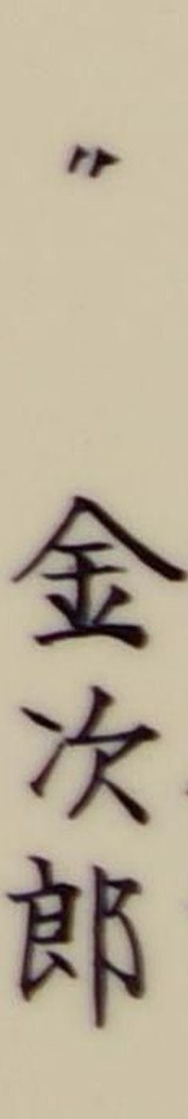金次郎
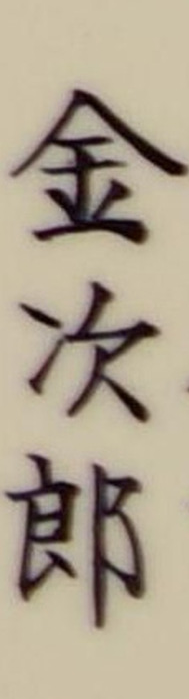金次郎
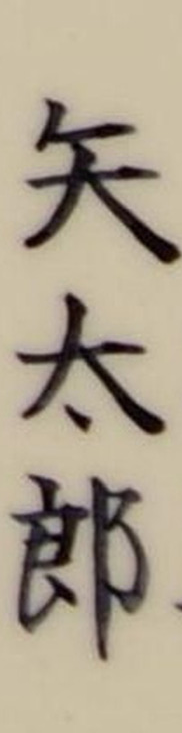矢太郎
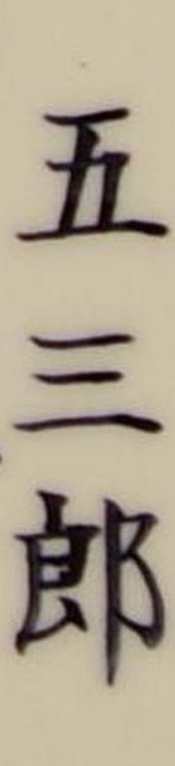五三郎
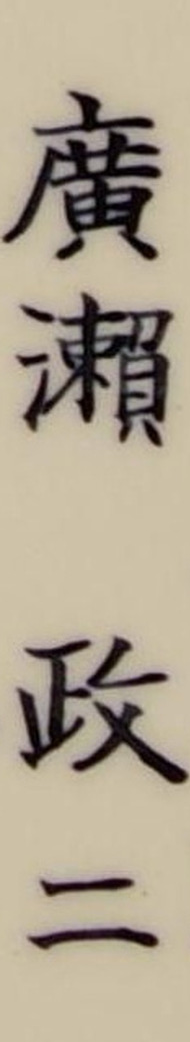廣瀬政二
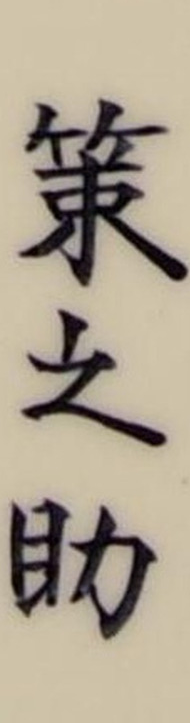策之助
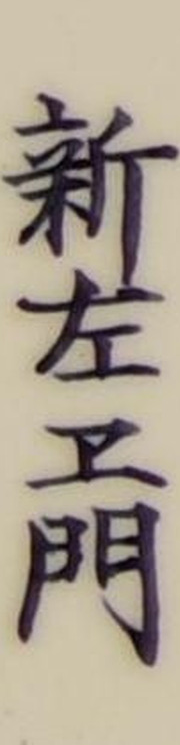新左ヱ門

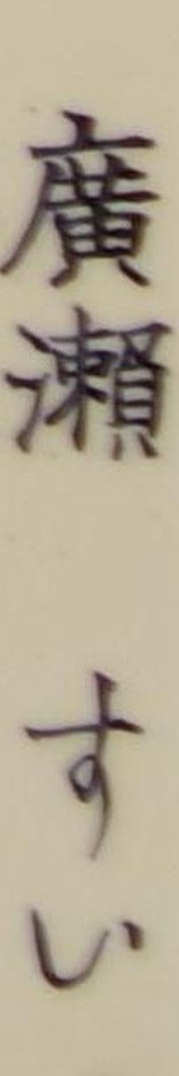廣瀬すい
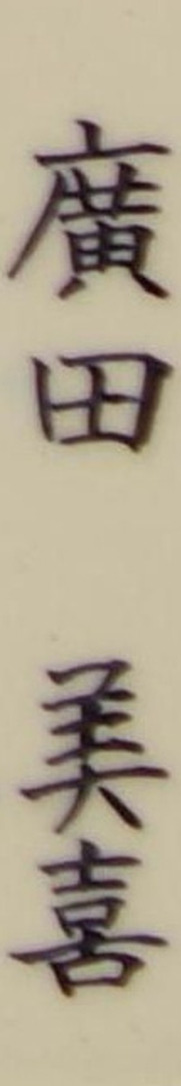廣田美喜
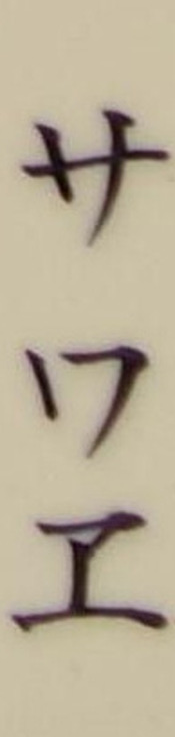サワエ
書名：A~D
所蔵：koyasan kongobuji
